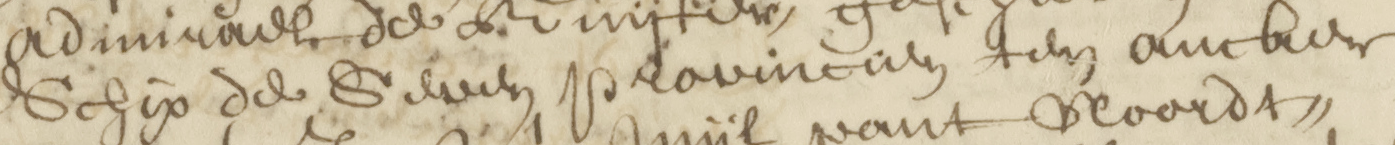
Schip de Seven provincien ten ancker
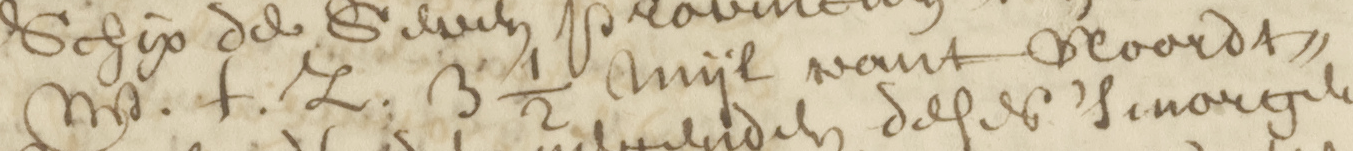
Ms. t. Z. 3½ Mijl vant Noordt„
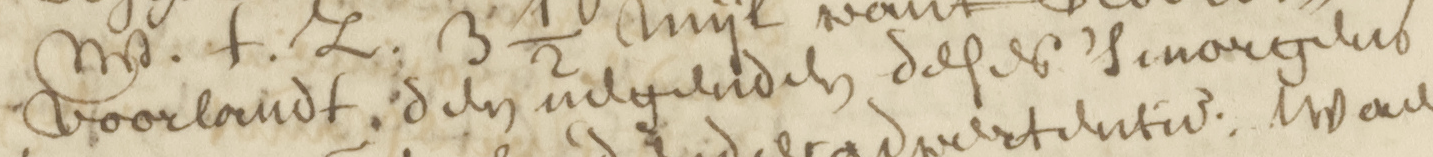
voorlandt, den negenden deses ‛smorgens
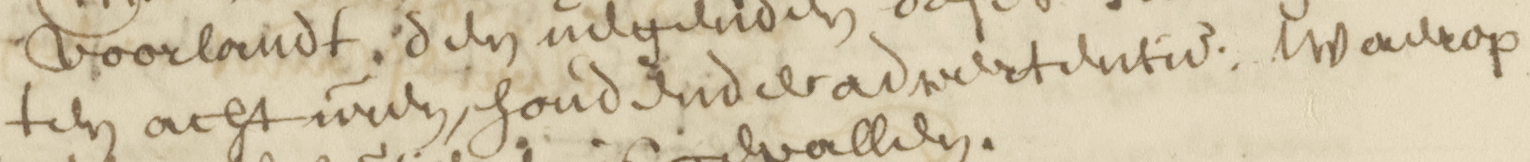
ten acht uren, houdende advertentie. Waerop
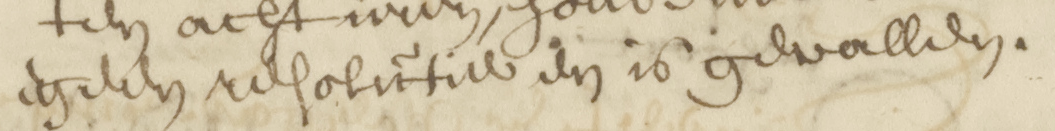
egeen resolutie en is gevallen.
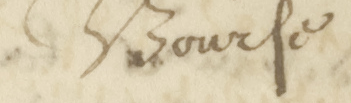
Bourse
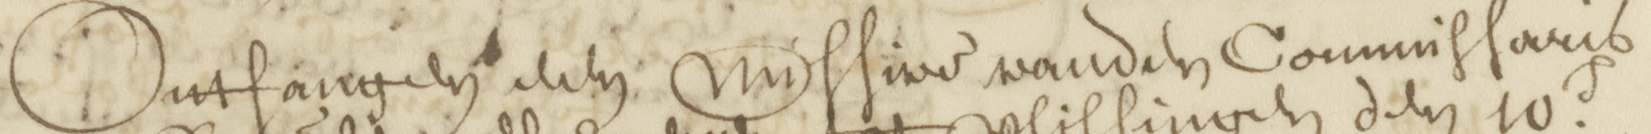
Ontfangen een Missive vanden Commissaris
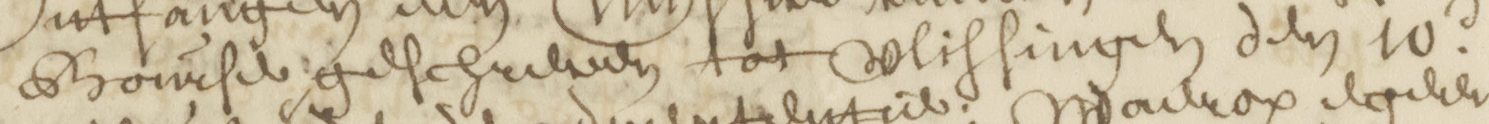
Bourse, geschreven tot Vlissingen den 10en.
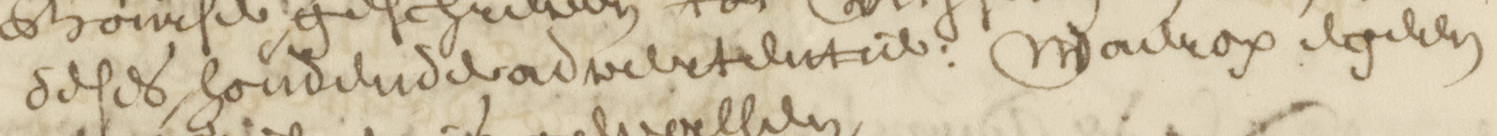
deses, houdende advertentie: Waerop egeen
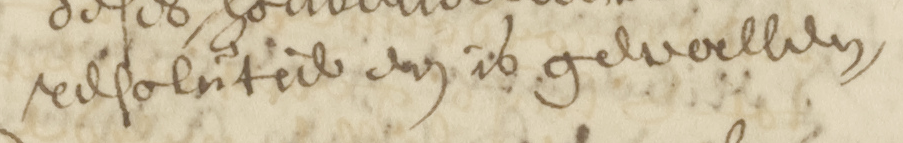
resolutie en is gevallen.
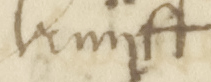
knijff
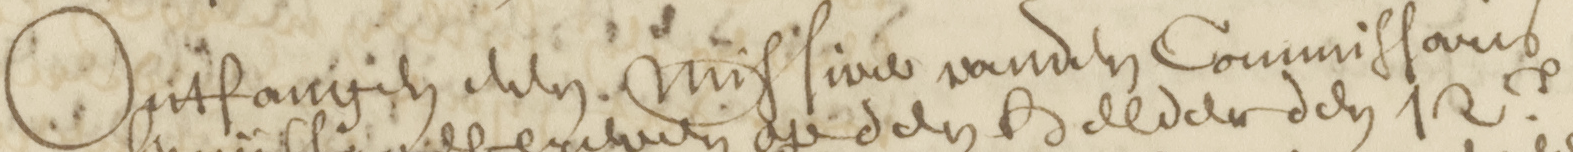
Ontfangen een Missive vanden Commissaris
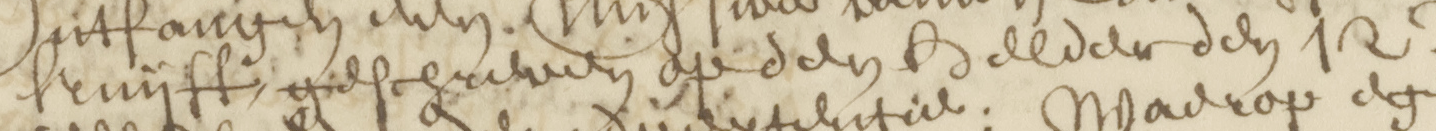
Knijff, geschreven op den Helder den 12en.
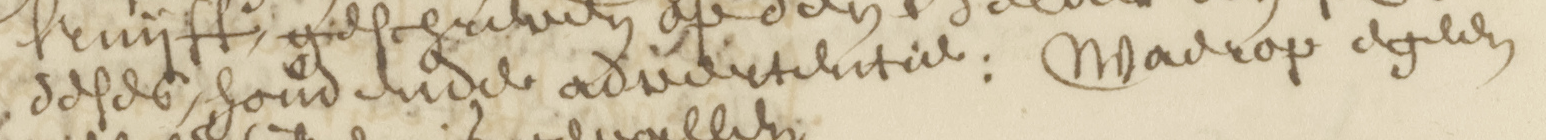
deses, houdende advertentie: Waerop egeen
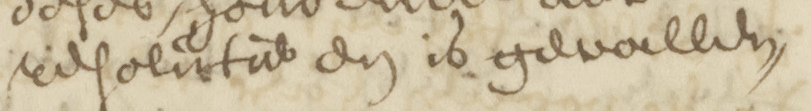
resolutie en is gevallen.
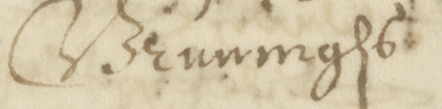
Bruninghs
